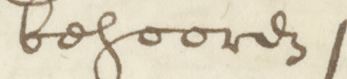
behooren.
